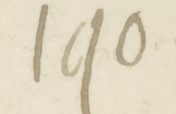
140
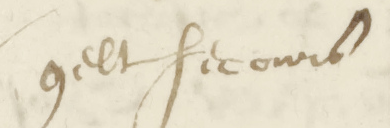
gelt secours
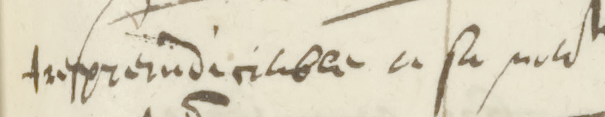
trespreiudiciable a sa mate
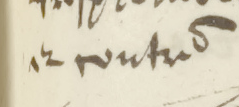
et contrad
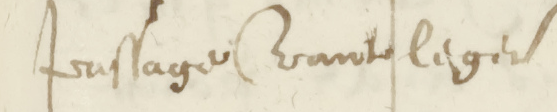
passage vant leger
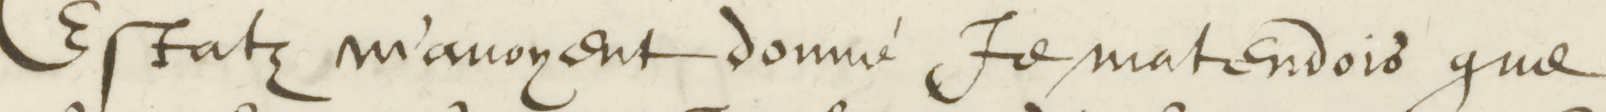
Estatz m' auoyent donné je matendois que
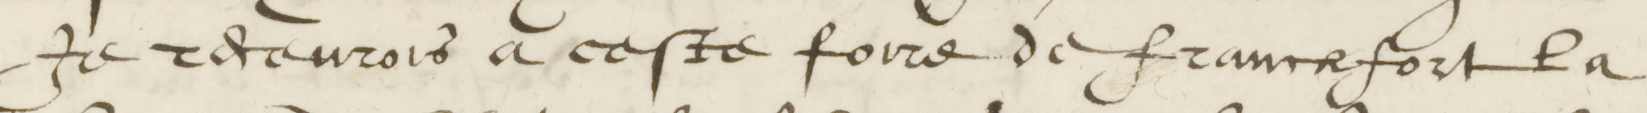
je receurois a ceste foire de franckfort la
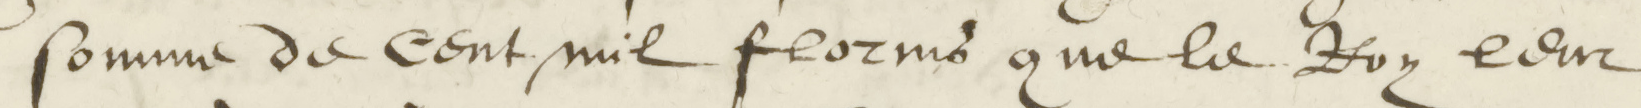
somme de cent mil florins que le Roy leur
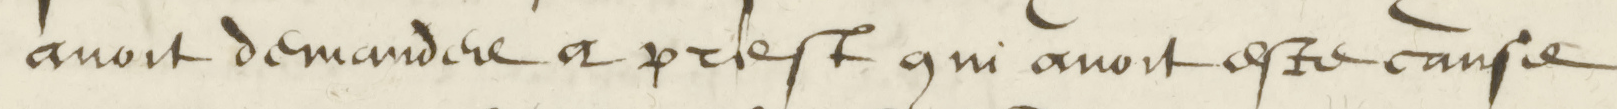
auoit demandee a prest qui auoit este cause
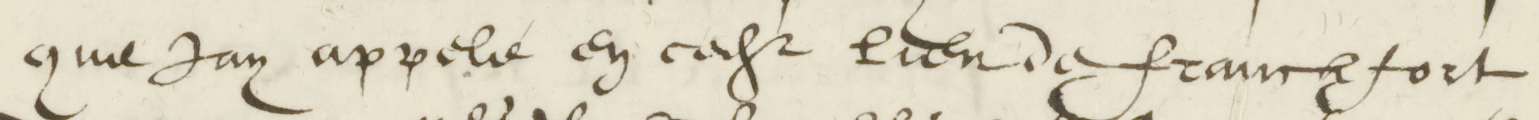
que Jay appelé en cedt lieu de franckfort
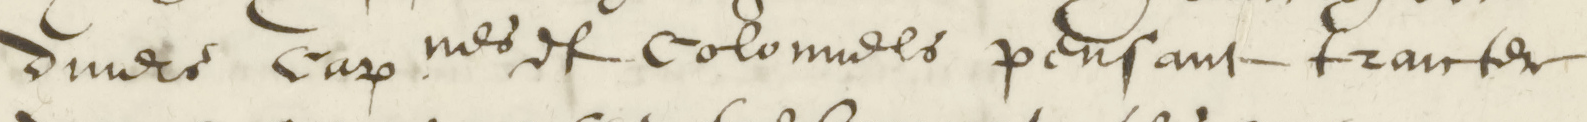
diuers cap.nes et colonnels pensant traicter
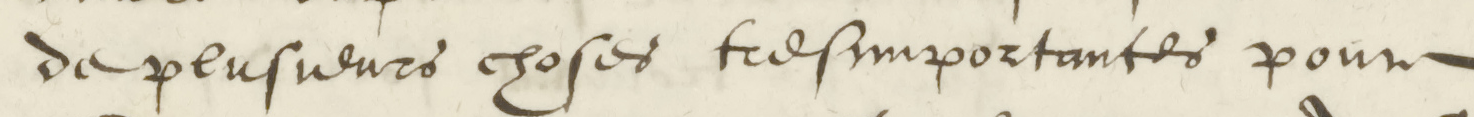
de plusieurs choses tres importantes pour
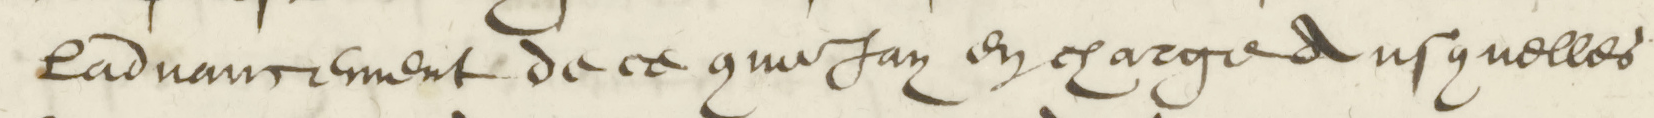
laduancement de ce que Jay en charge Ausquelles
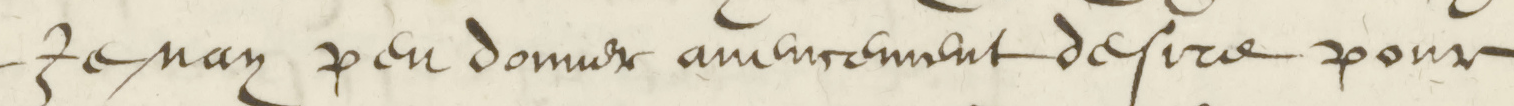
Je nay peu donner auencement desire pour
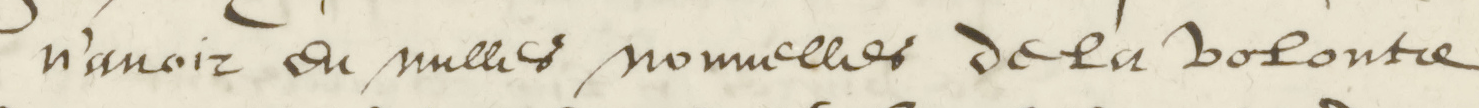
n'auoir eu nulles nouuelles de la volonte
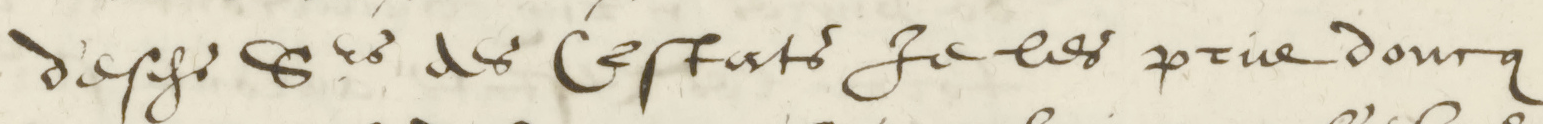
d'esds Srs des Estats Je les prie doncq
